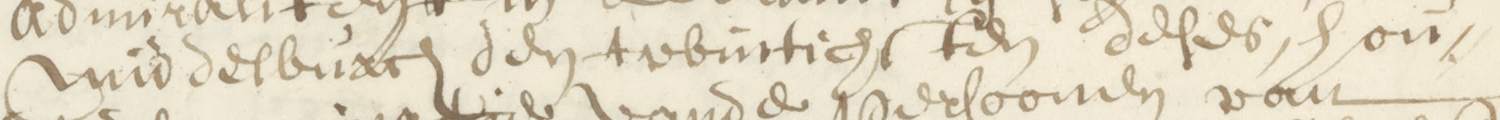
Middelburch den twintichsten deses, hou„
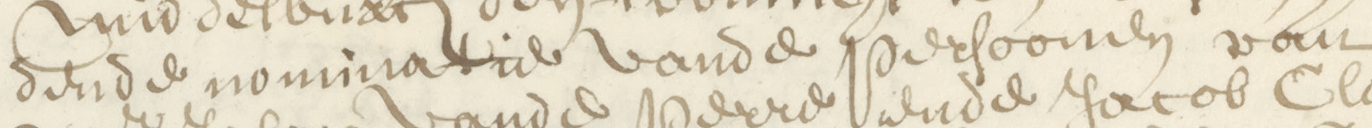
dende nominatie vande persoonen van
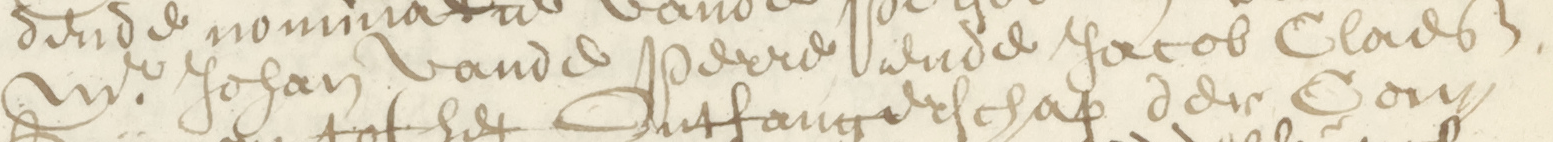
Mr. Johan vande Perre ende Jacob Claesz.
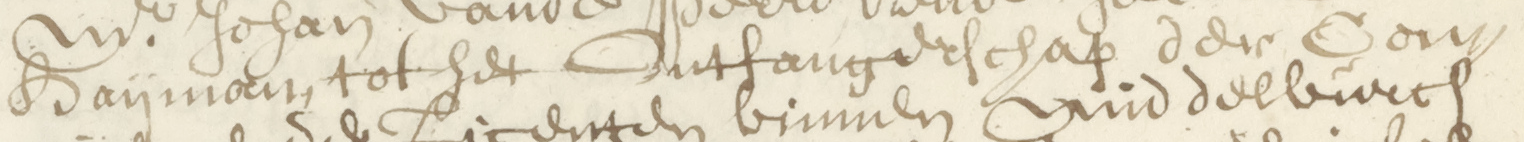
Haijman, tot het Ontfangerschap der Con„
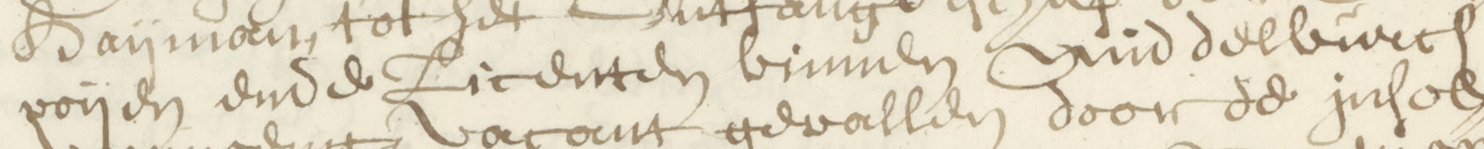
voijen ende Licenten binnen Middelburch
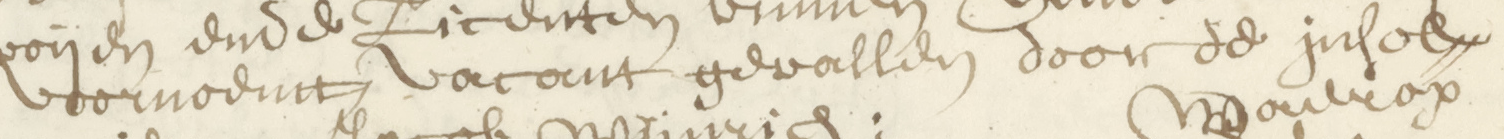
voornoemt, vacant gevallen door de insol„
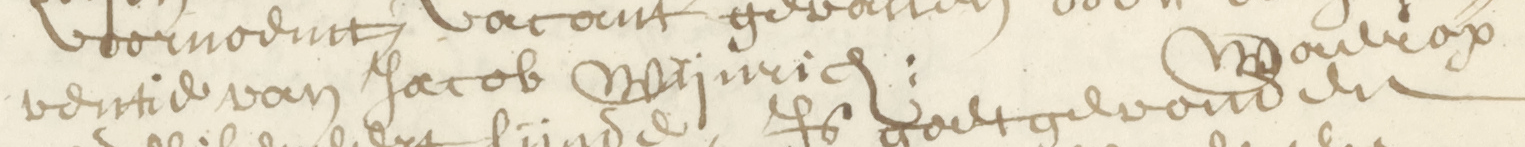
ventie van Jacob Wijnrich: Waerop
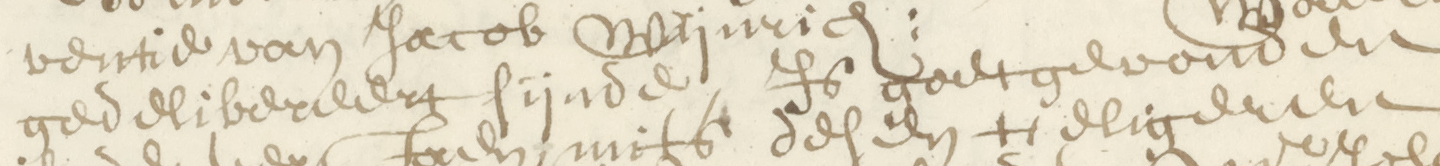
gedelibereert sijnde, Is goetgevonden
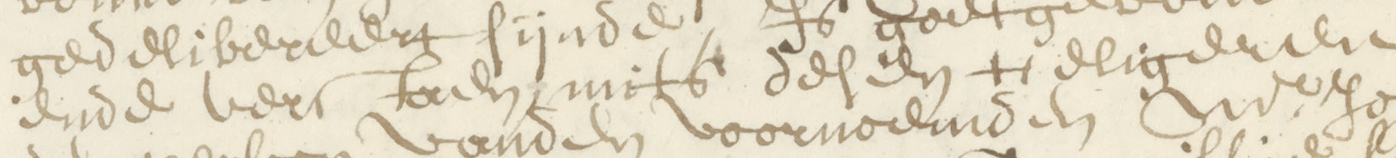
ende verstaen, mits desen t‛eligeren
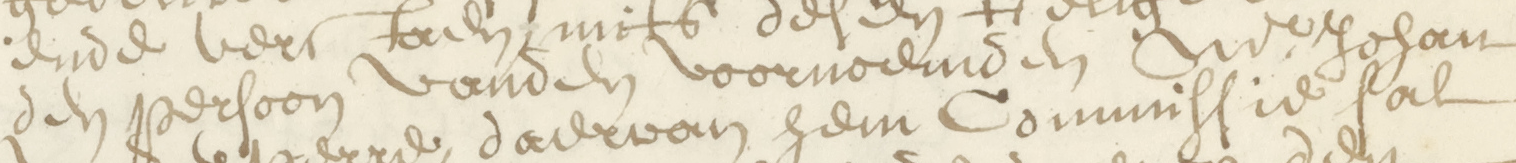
den persoon vanden voornoemden Mr. Johan
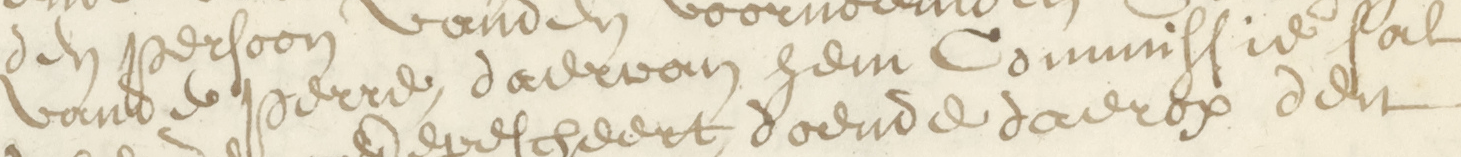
vande Perre, daervan hem Commissie sal
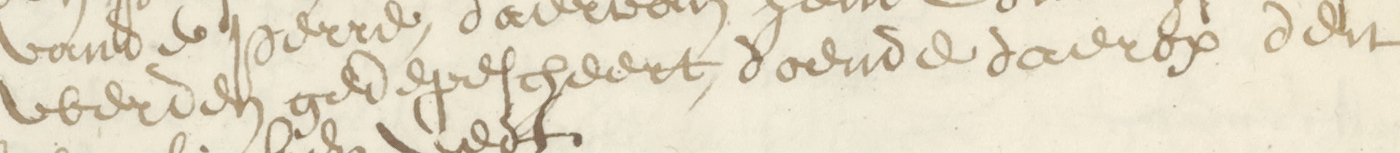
werden gedepescheert, doende daerop den
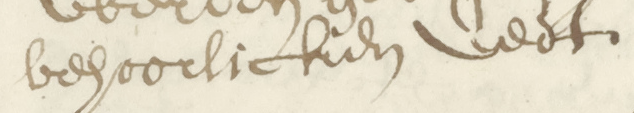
behoorlicken Eedt.
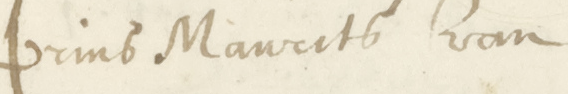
Prins Maurits van
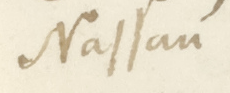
Nassau
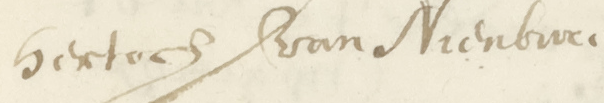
hertoch van Nieuborch
